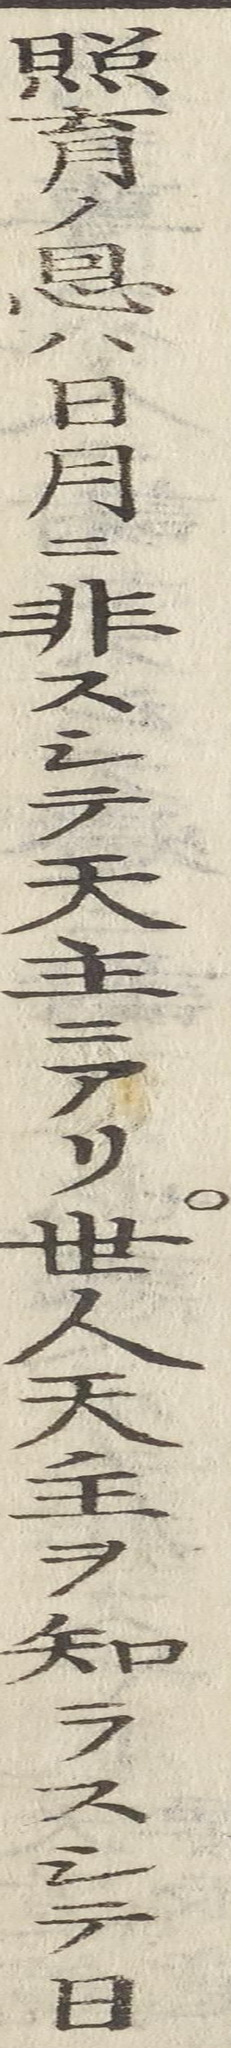照育ノ恩ハ日月ニ非スシテ天主ニアリ。世人天主ヲ知ラスシテ日

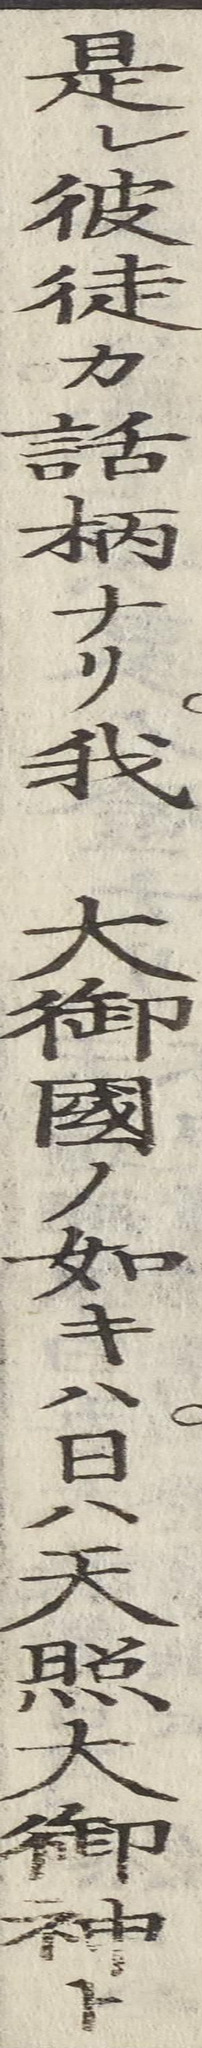是レ彼徒カ話柄ナリ。我大御国ノ如キハ。日ハ天照大御神ト
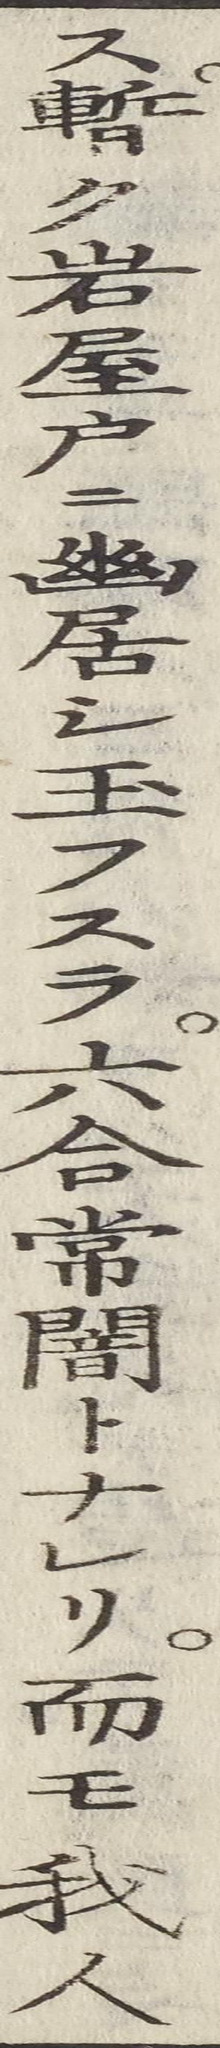ス。暫ク岩屋戸ニ幽居シ玉フスラ。六合常闇トナレリ。而モ我人
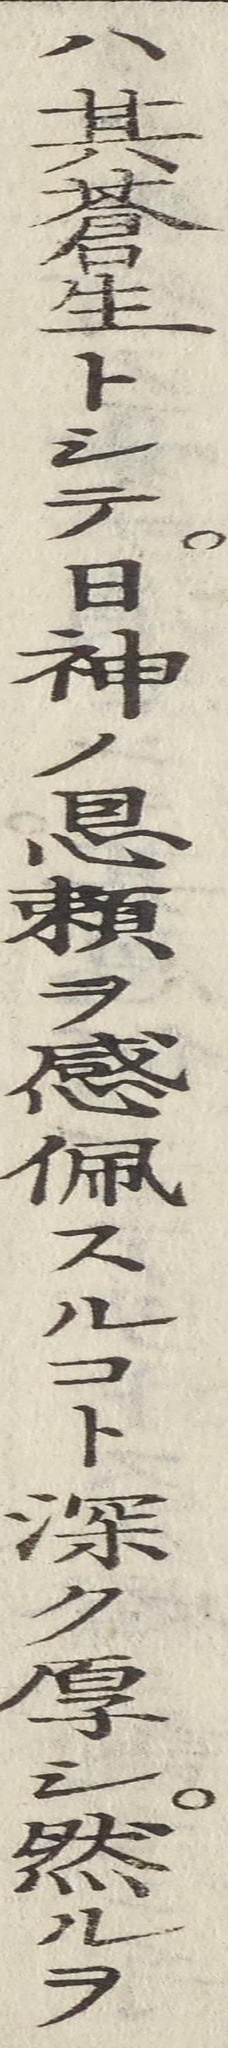ハ其蒼生トシテ。日神ノ恩頼ヲ感佩スルコト深ク厚シ。然ルヲ
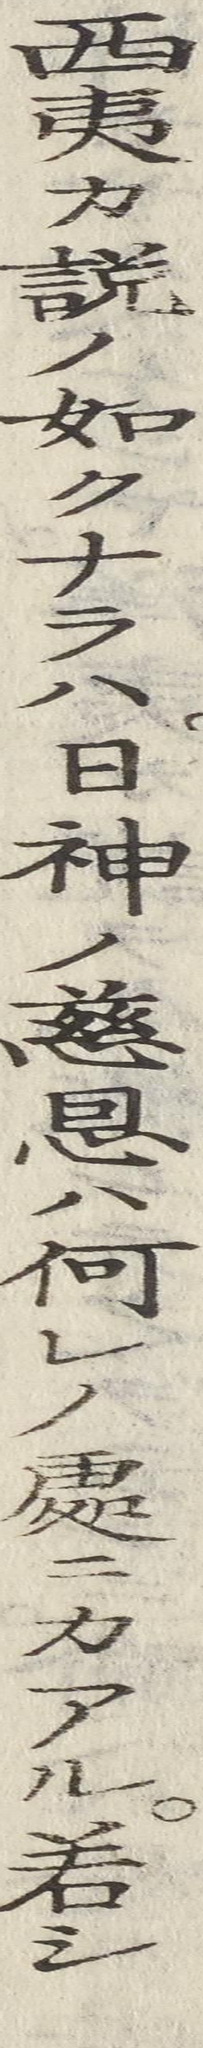西夷カ説ノ如クナラハ。日神ノ慈恩ハ何レノ処ニカアル。若シ
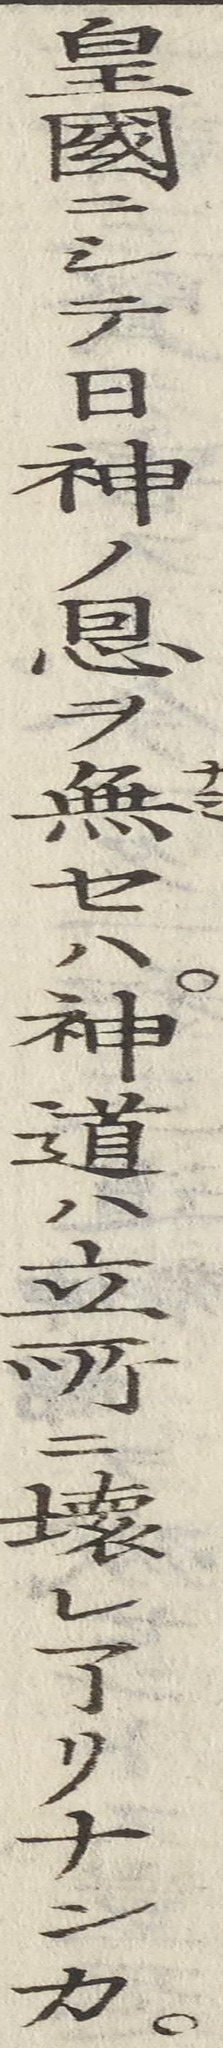皇国ニシテ日神ノ恩ヲ無セハ。神道ハ立所ニ壊レ了リナンカ。
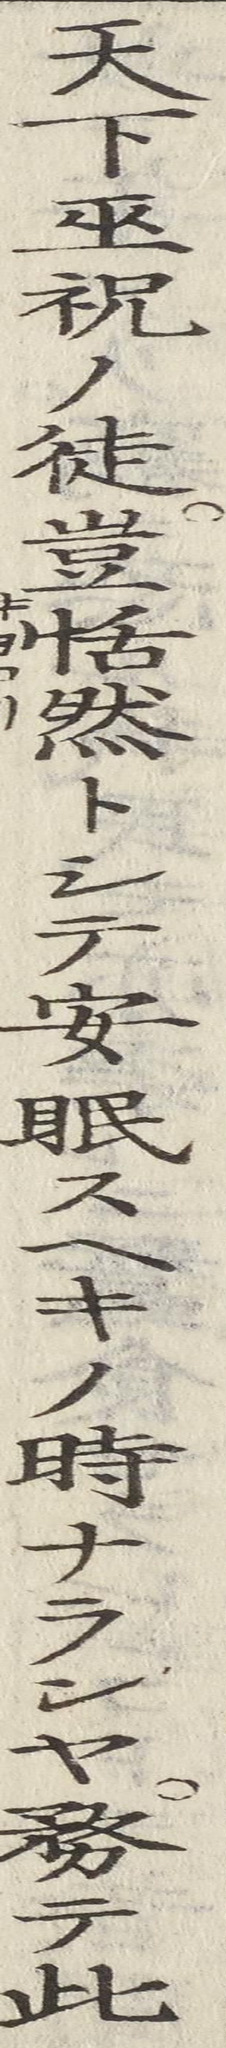天下坐祝ノ徒。豈恬然トシテ安眠スヘキノ時ナランヤ。務テ此
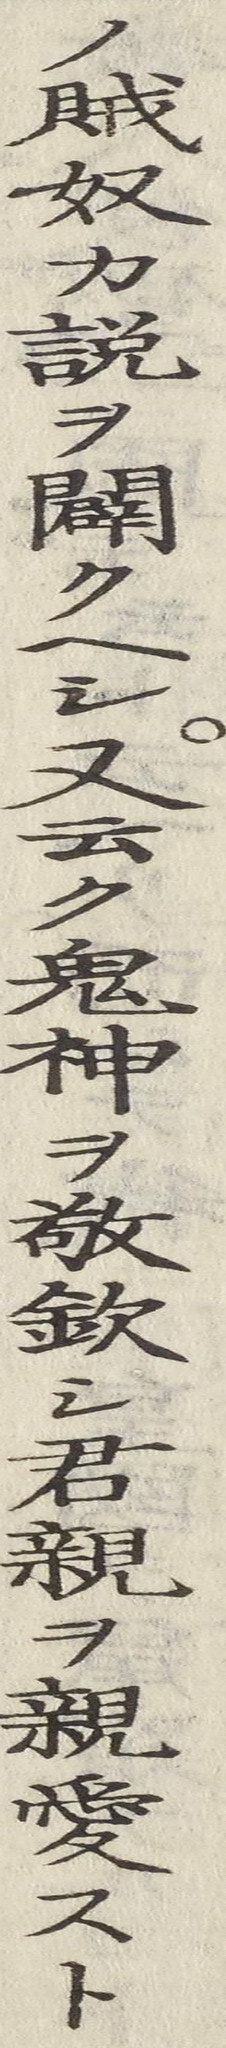ノ賊奴カ説ヲ闢クヘシ。又云ク鬼神ヲ敬欽シ君親ヲ親愛スト
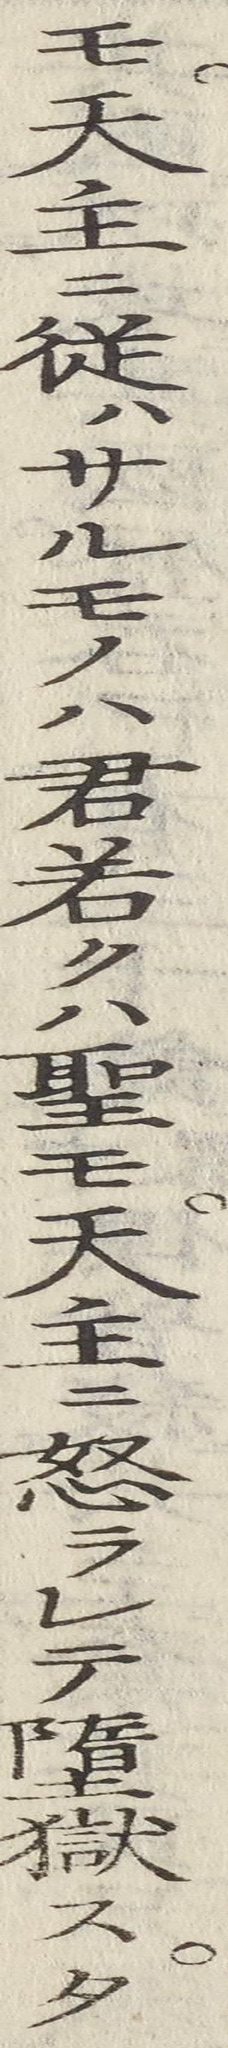モ。天主ニ従ハサルモノハ君若クハ聖モ。天主ニ怒ラレテ堕獄ス。タ
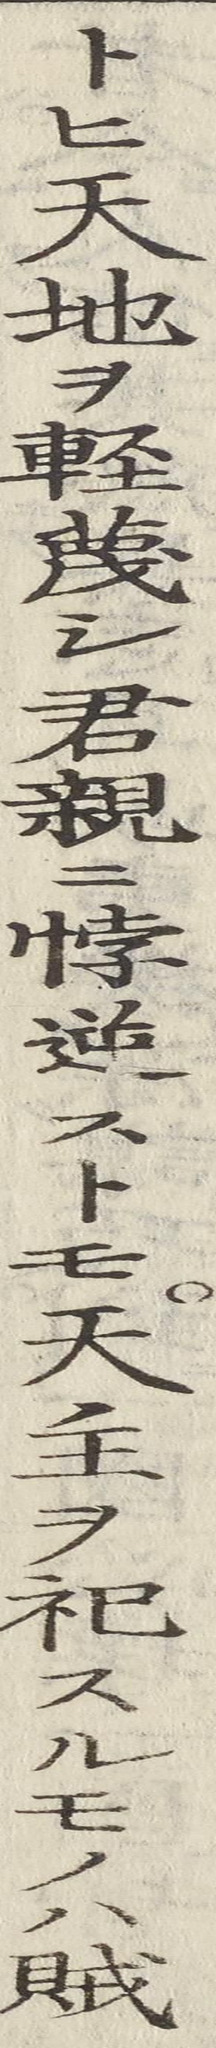トヒ天地ヲ軽蔑シ君親ニ悖逆ストモ。天主ヲ祀スルモノハ賊
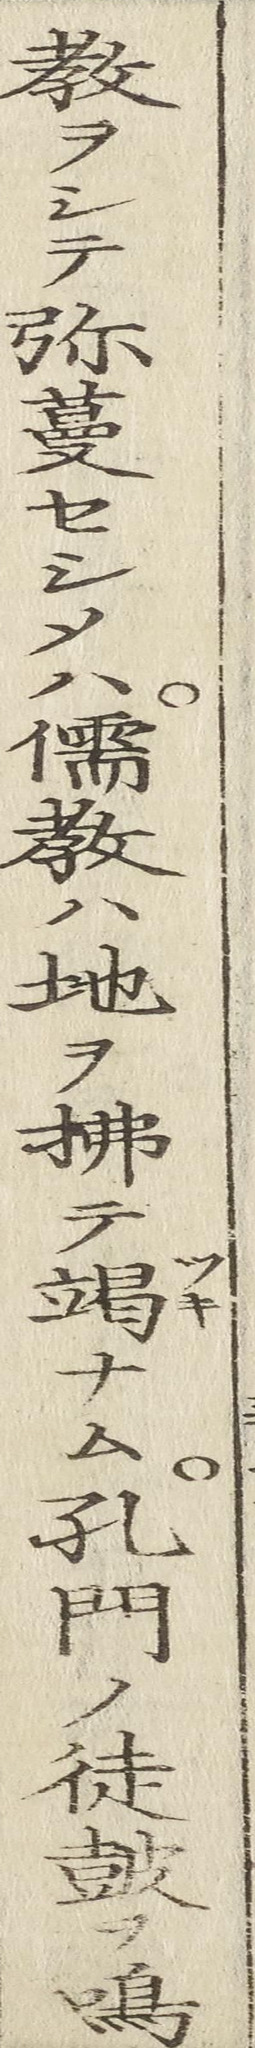教ヲシテ弥蔓セシメハ。儒教ハ地ヲ払テ竭ナム。孔門ノ徒皷ヲ鳴
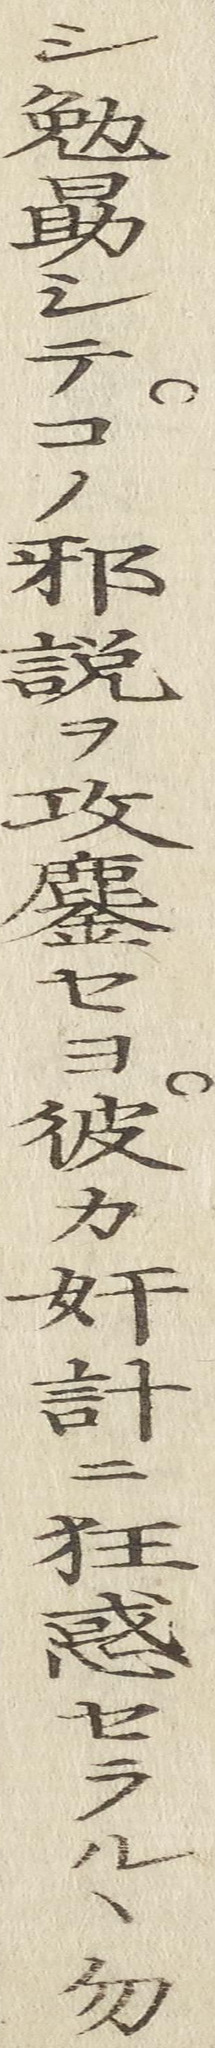シ勉勗シテ。コノ邪説ヲ攻鏖セヨ。彼カ奸計ニ狂惑セラルヽ勿
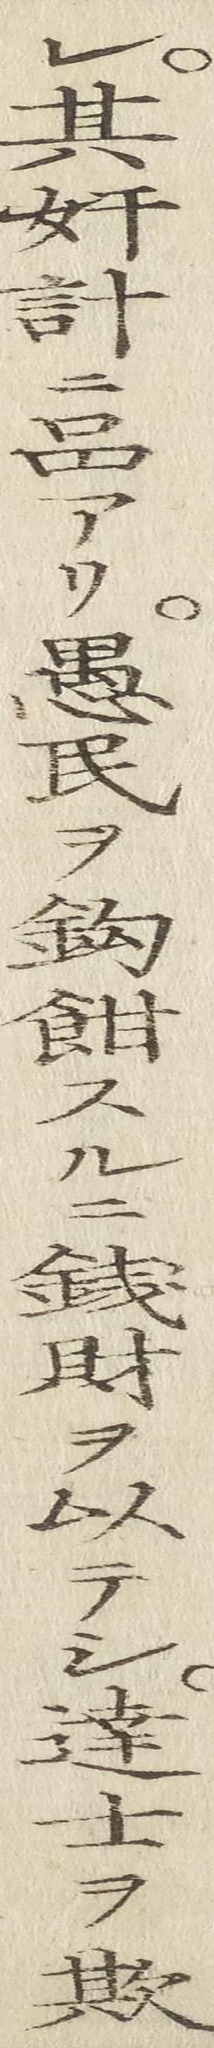レ。其奸計ニ品アリ。愚民ヲ鈎餌スルニ銭財ヲ以テシ。達士ヲ欺
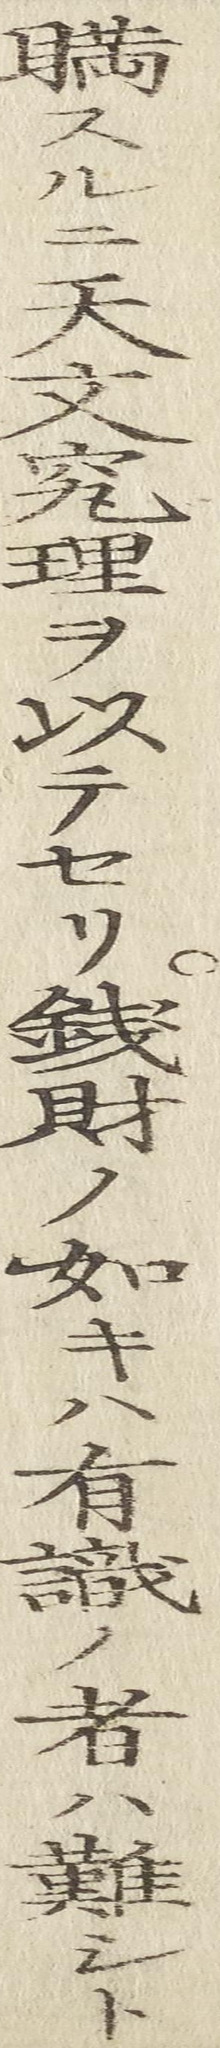瞞スルニ天文究理ヲ以テセリ。銭財ノ如キハ有識ノ者ハ難シト
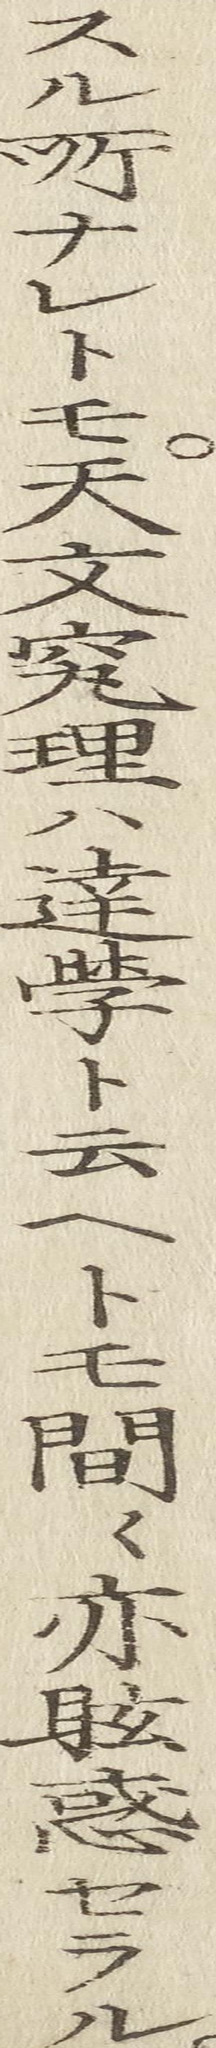スル所ナレトモ。天文究理ハ達学ト云ヘトモ間〱亦眩惑セラル。
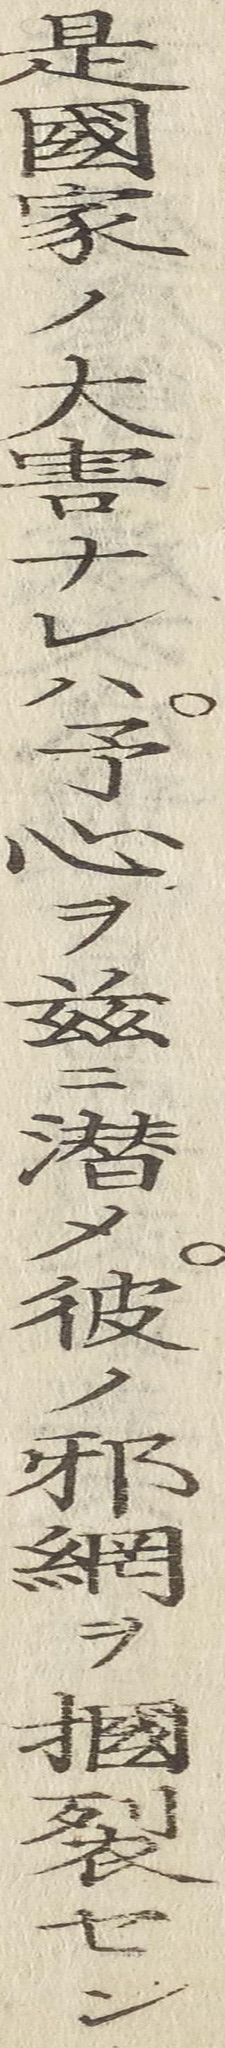是国家ノ大害ナレハ。予心ヲ茲ニ潜メ。彼ノ邪網ヲ掴裂セン
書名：護法新論　二編　上
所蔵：東京大学地震研究所図書室 Earthquake Research Institute Library, The University of Tokyo, JAPAN
